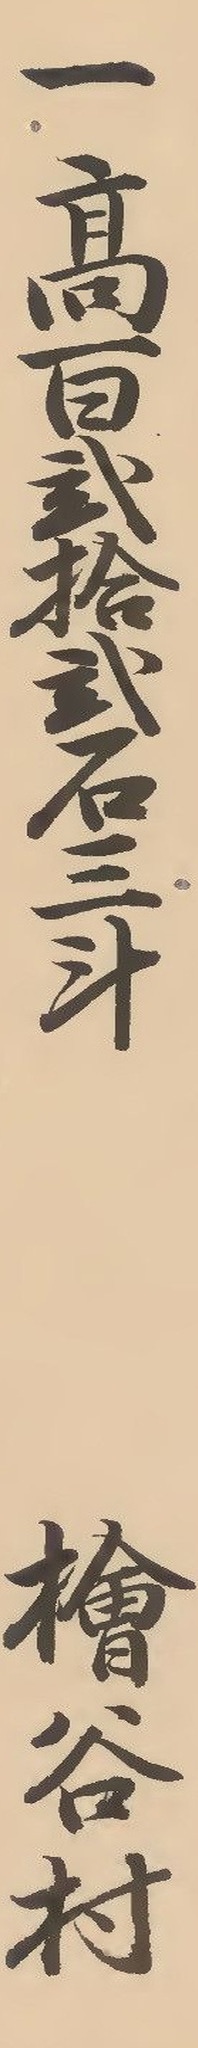一高百弐拾弐石三斗桧谷村

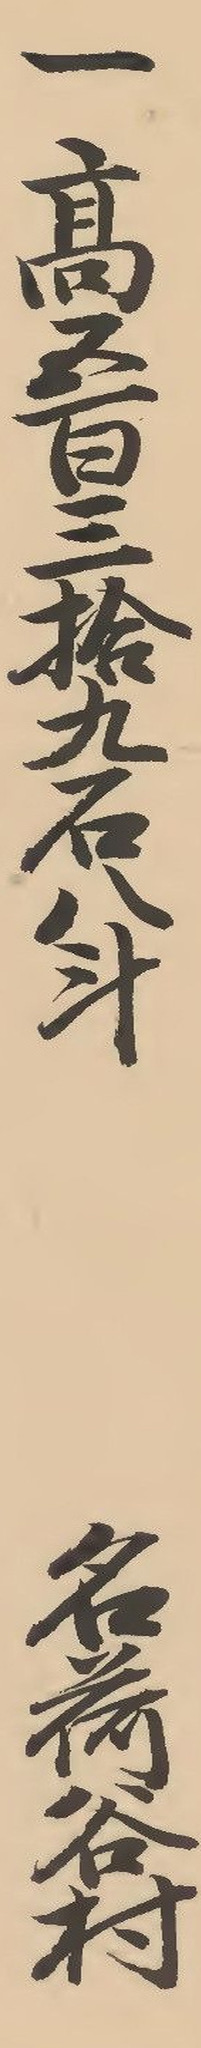一高五百三拾九石八斗名荷谷村
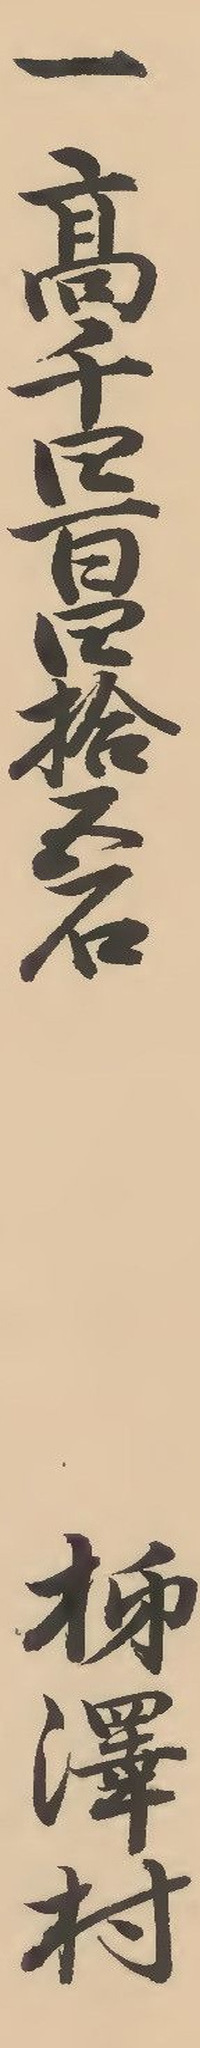一高千四百四拾五石柿沢村
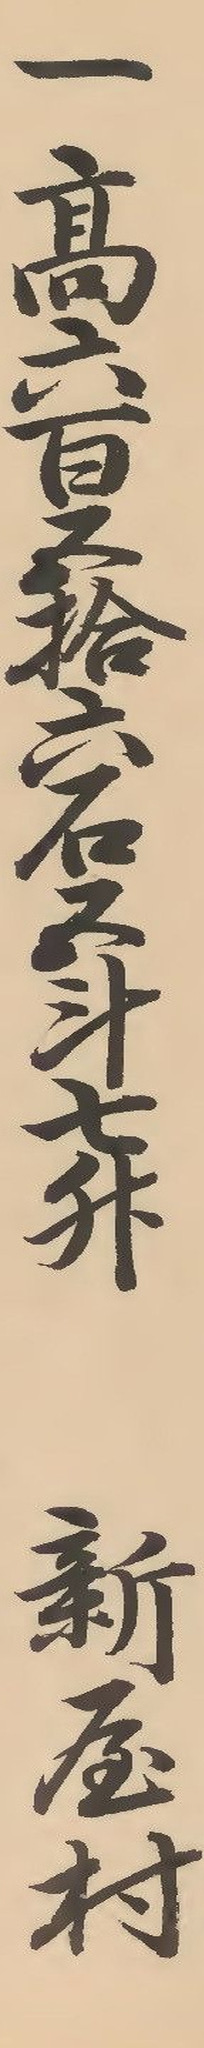一高六百五拾六石五斗七升新屋村
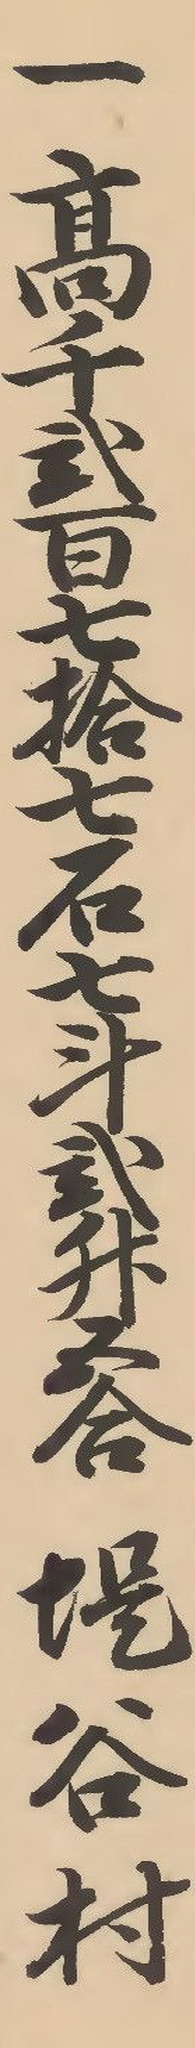一高千六百八拾五石七斗弐升九合稗田村
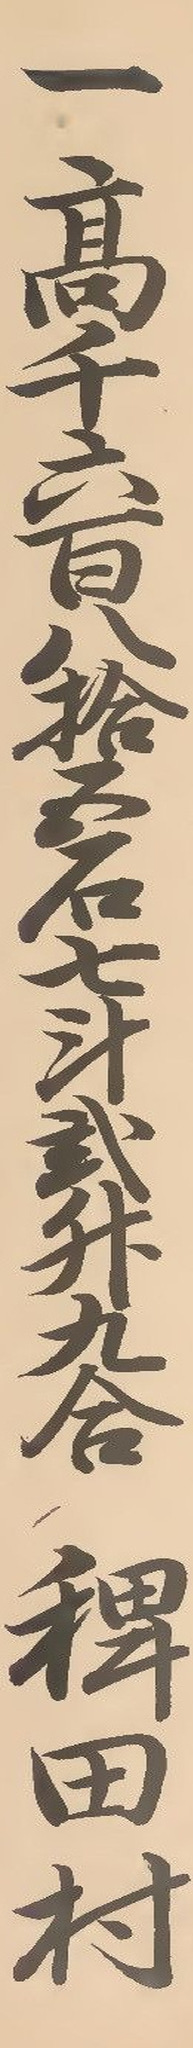一高千六百八拾五石七斗弐升九合稗田村
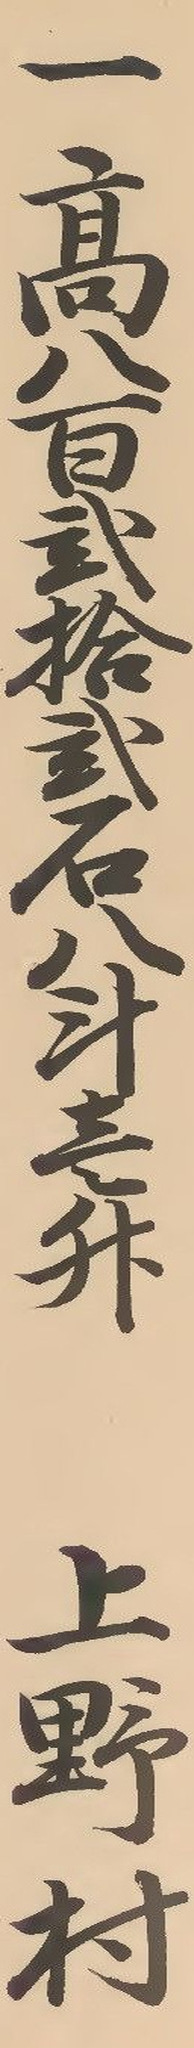一高八百弐拾弐石八斗壱升上野村
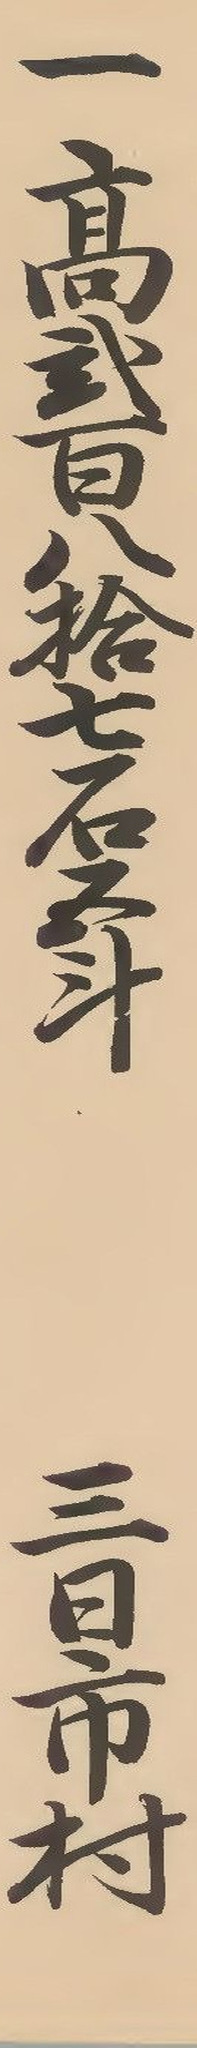一高弐百八拾七石五斗三日市村

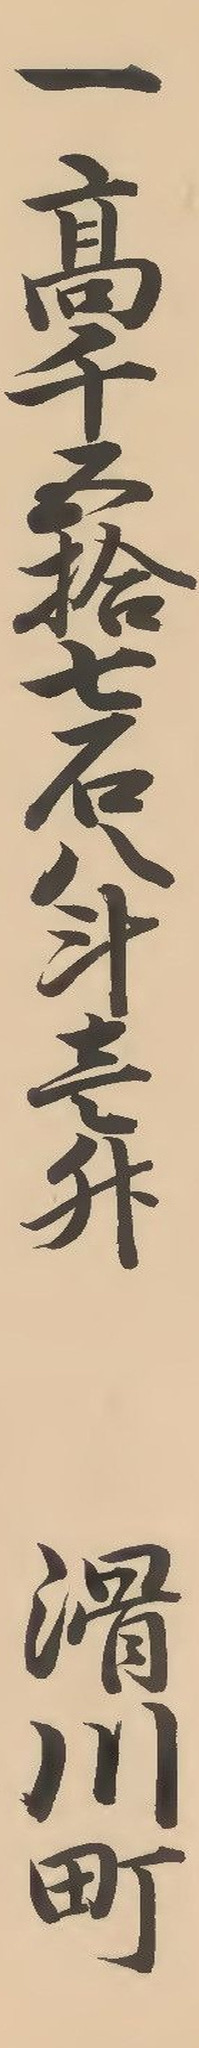一高千五拾七石八斗壱升滑川町
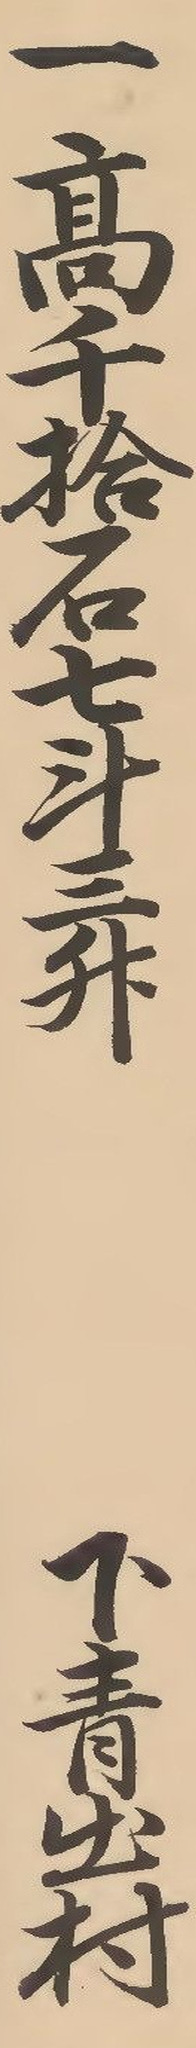一高千拾石七斗三升下青出村
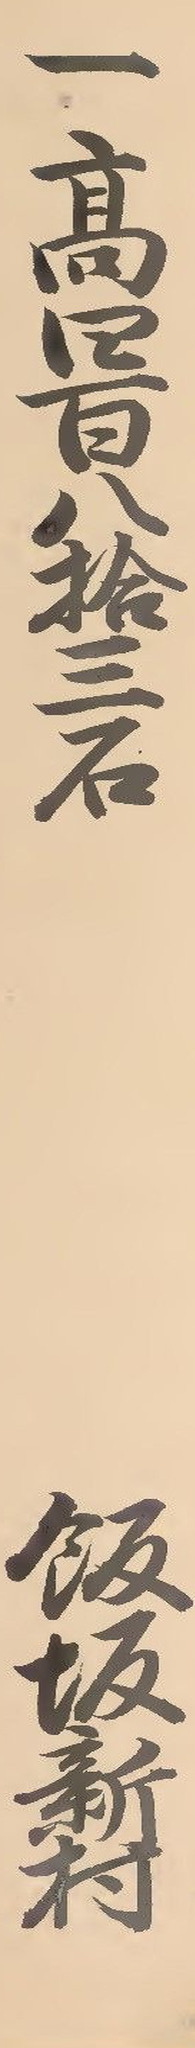一高四百八拾三石飯坂新村
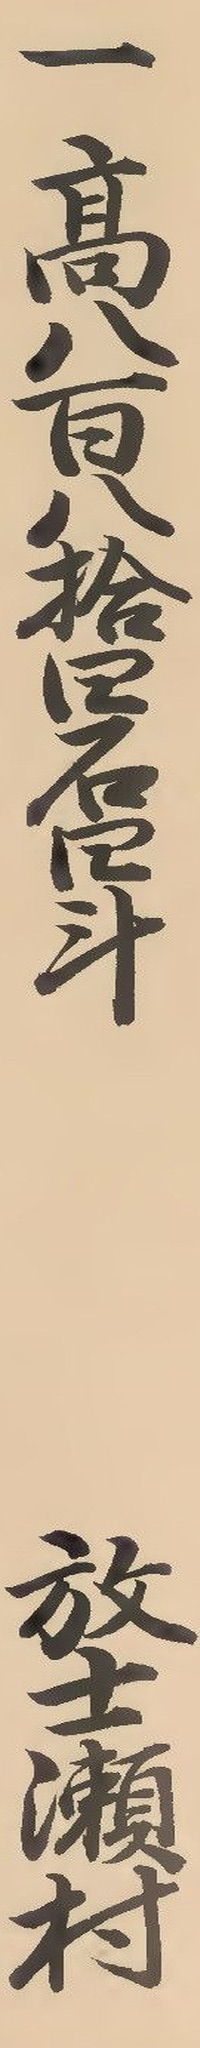一高八百八拾四石四斗放士瀬村
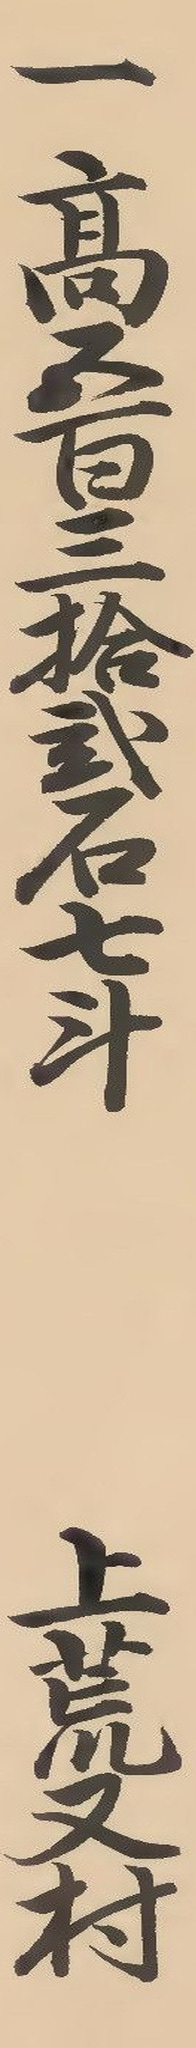一高五百三拾弐石七斗上荒又村
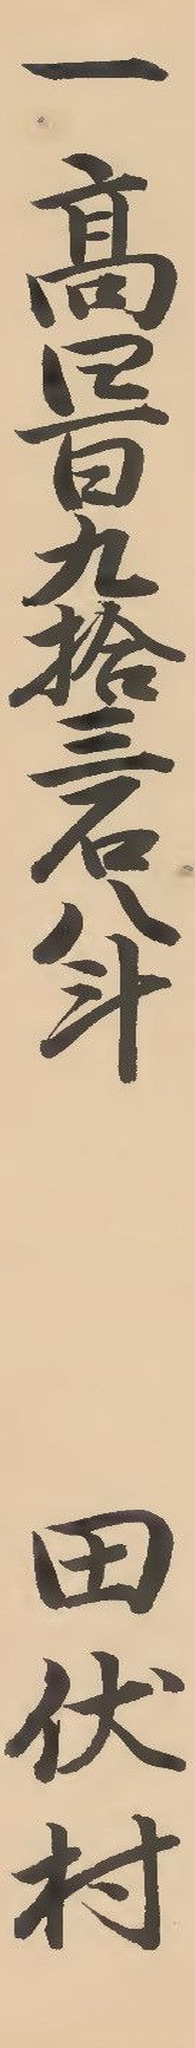一高四百九拾三石八斗田伏村

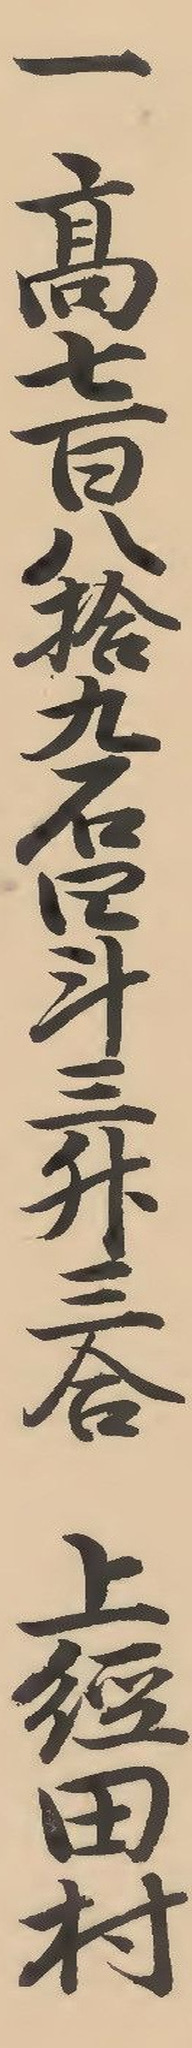一高七百八拾九石四斗三升三合上経田村
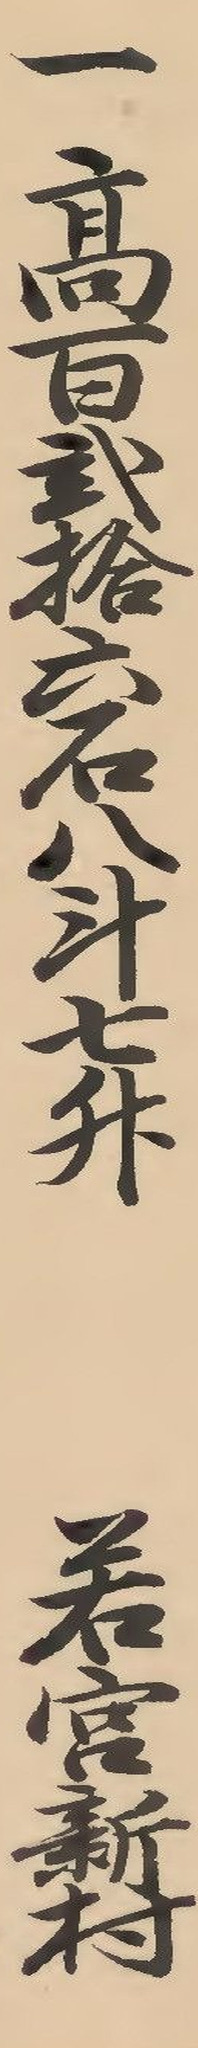一高百弐拾六石八斗七升若宮新村
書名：越中国郷帳
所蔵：国立公文書館 National Archives of Japan
